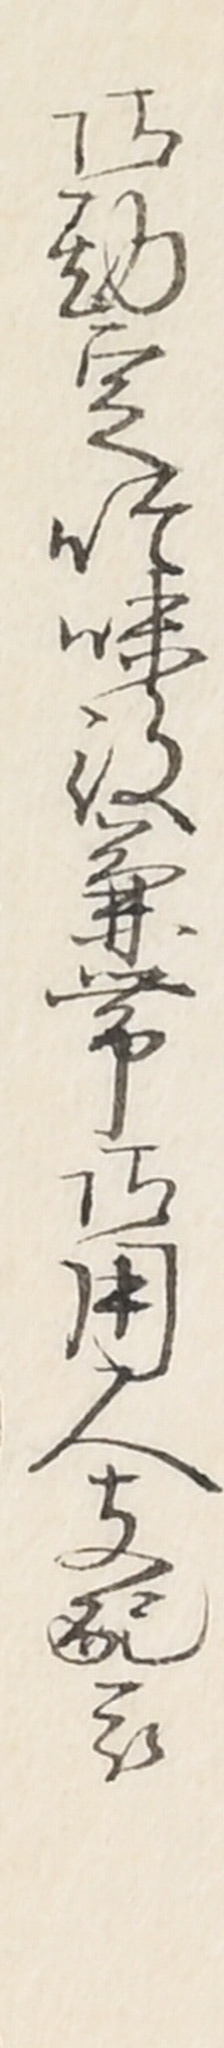御勘定吟味役兼帯御用人支配被
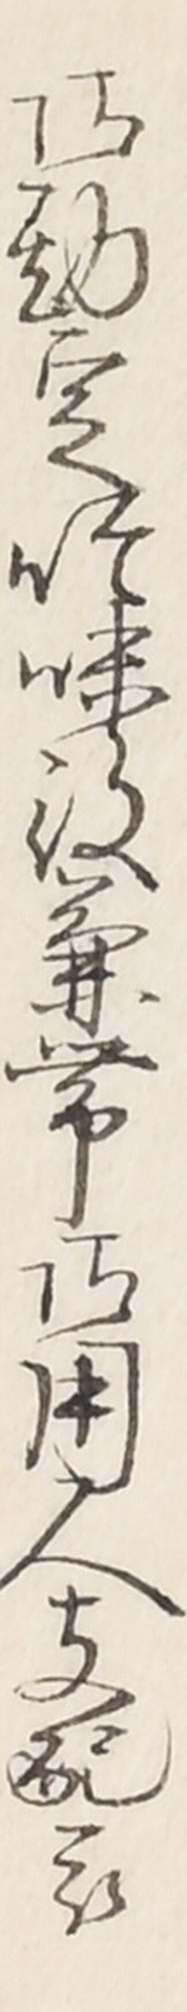御勘定吟味役兼帯御用人支配被
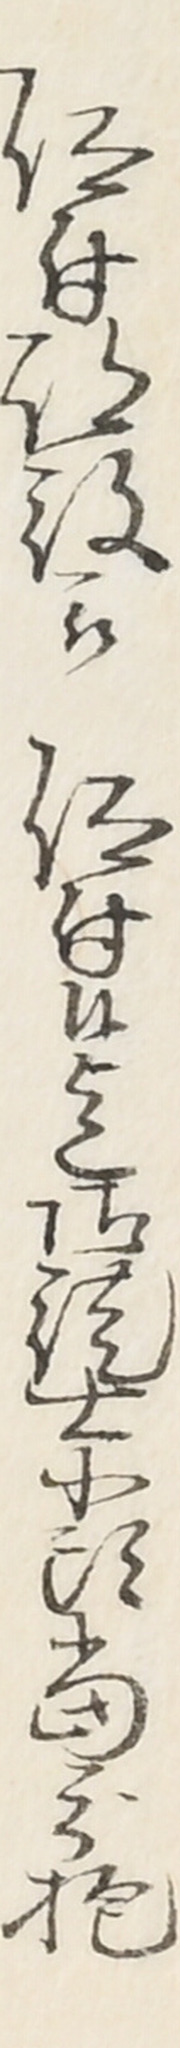仰付跡役被仰付候迄御徒士小頭当分抱
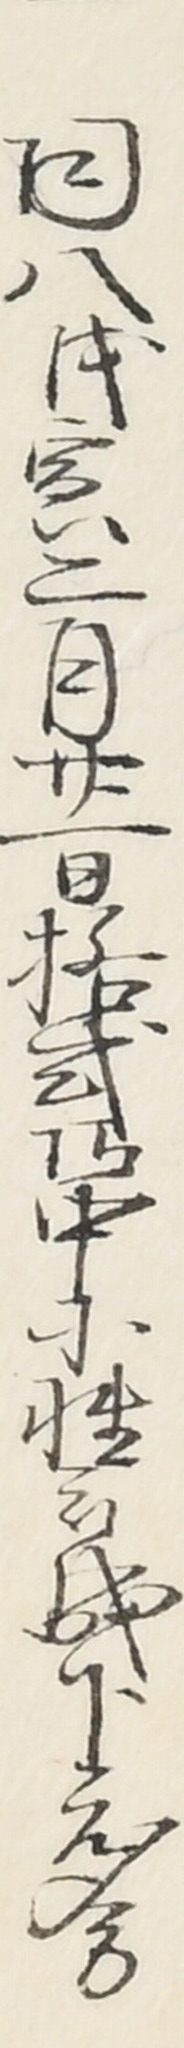一同八戊寅二月廿一日格式御中小性被成下元〆方
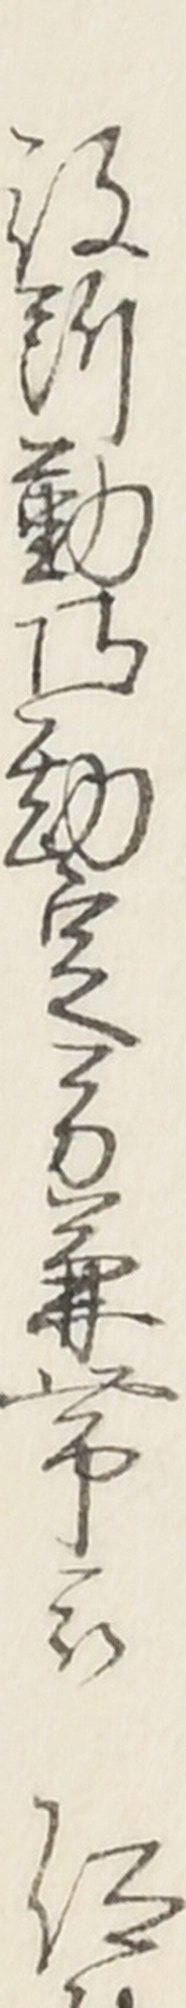役所勤御勘定方兼帯被仰付
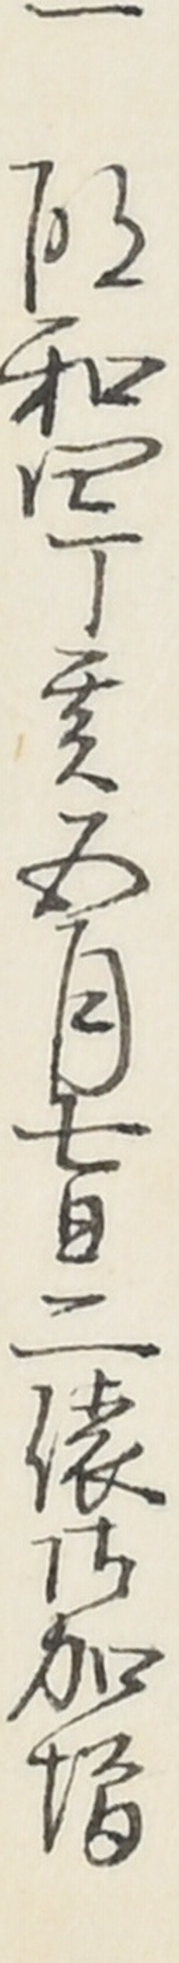一明和四丁亥五月七日二俵御加増
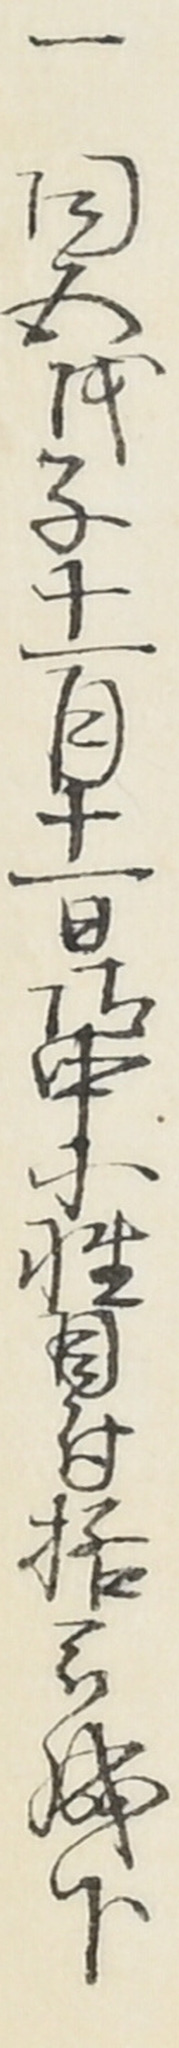一同五戊子十一月十一日御中小性目付格被成下
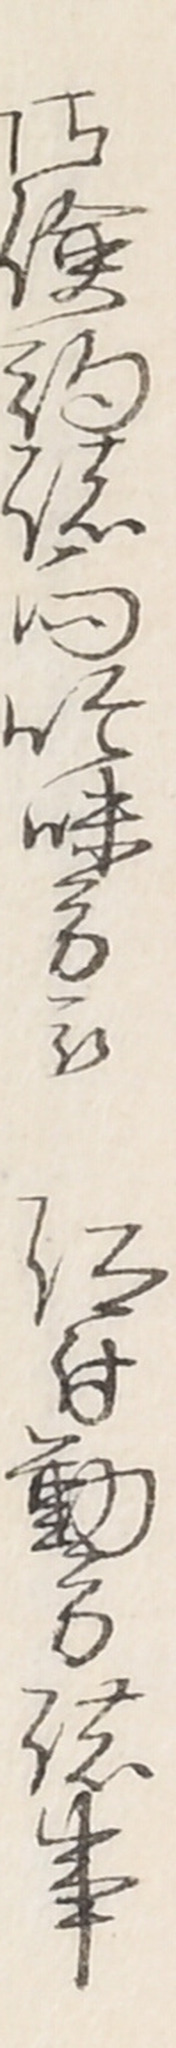御倹約諸向吟味方被仰付勤方諸事
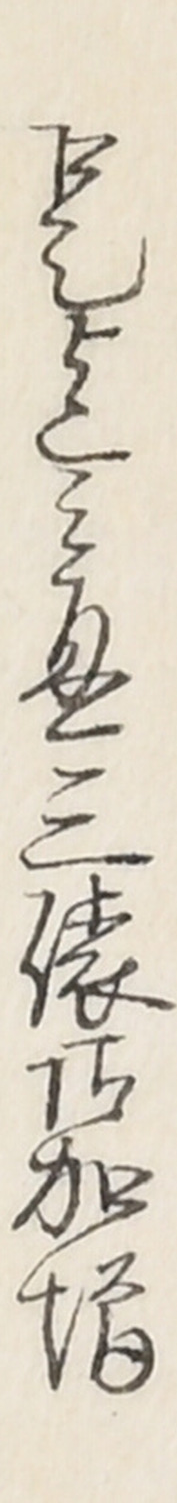是迄之通三俵御加増
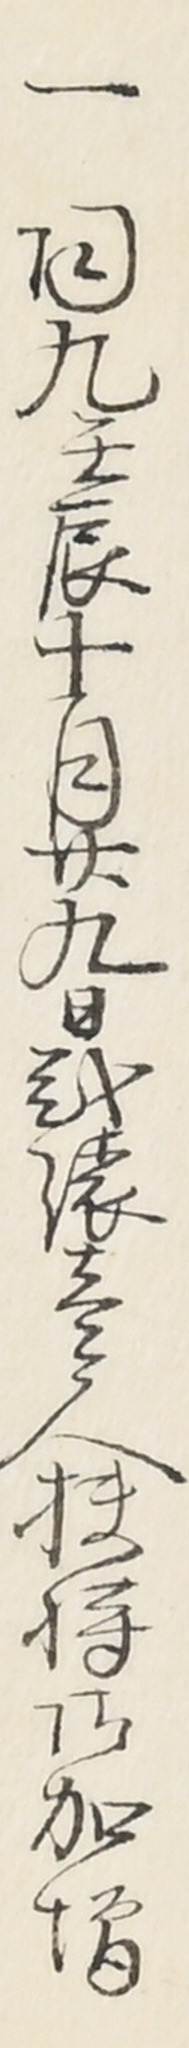一同九壬辰十月廿九日弐俵壱人扶持御加増
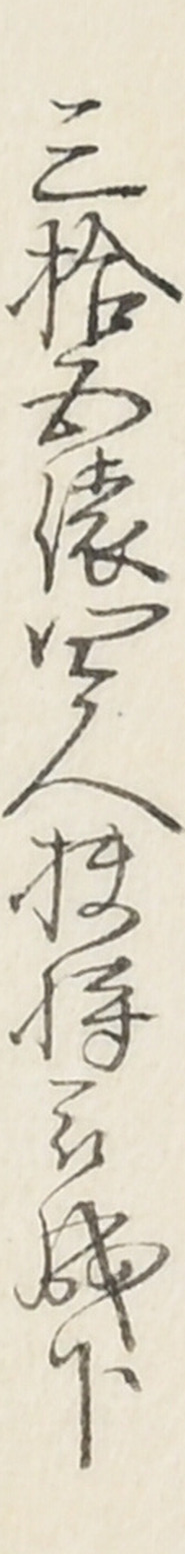三拾五俵四人扶持被成下
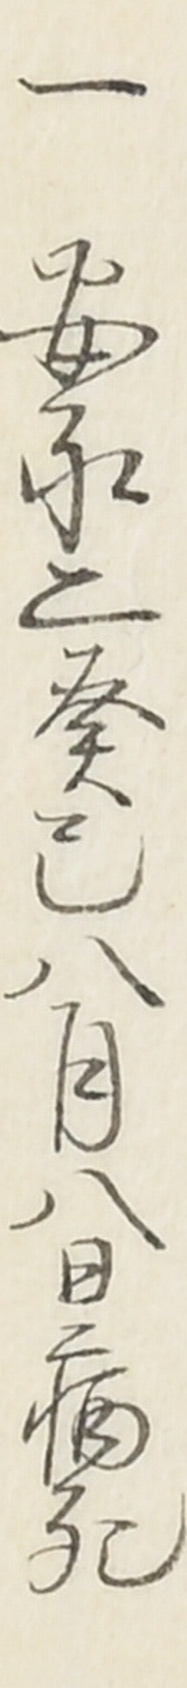一安永二癸巳八月八日病死
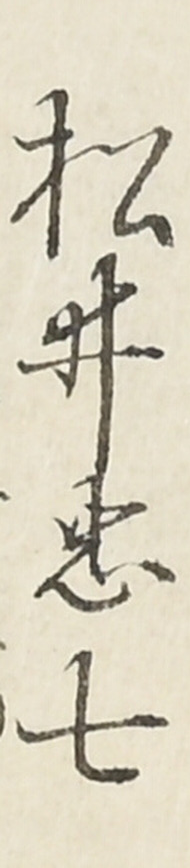松井忠七
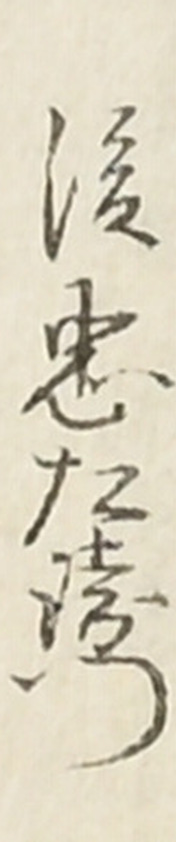後忠左衛門
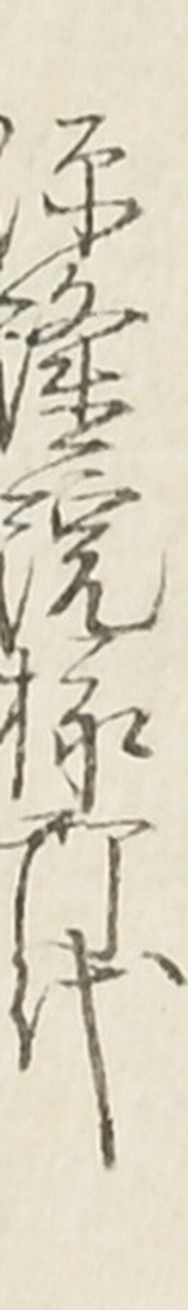源隆院様御代
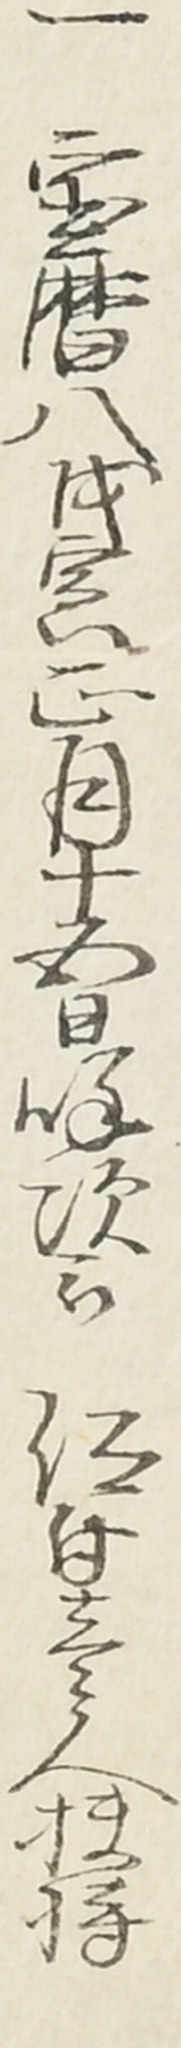一宝暦八戊寅正月十五日呼次被仰付壱人扶持
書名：無足諸士勤仕録（四）
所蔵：伊那市立高遠町図書館・合同会社AMANE
